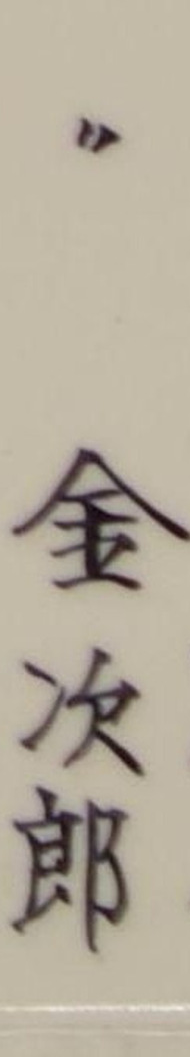金次郎
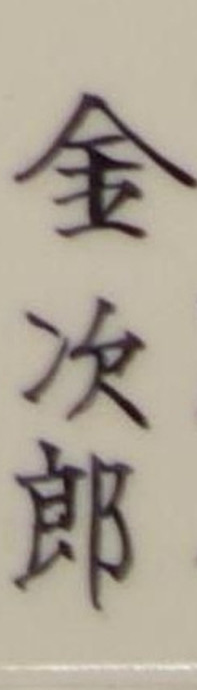金次郎
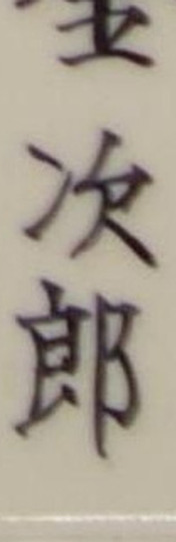金次郎
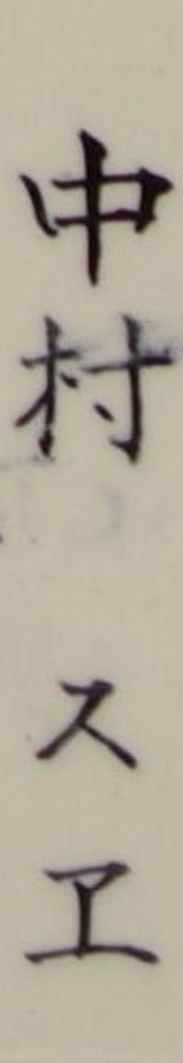中村スエ
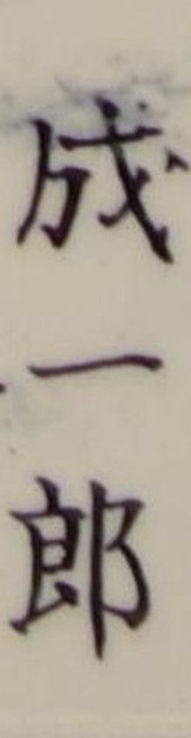成一郎
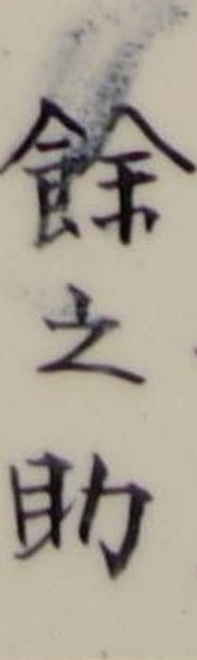餘之助
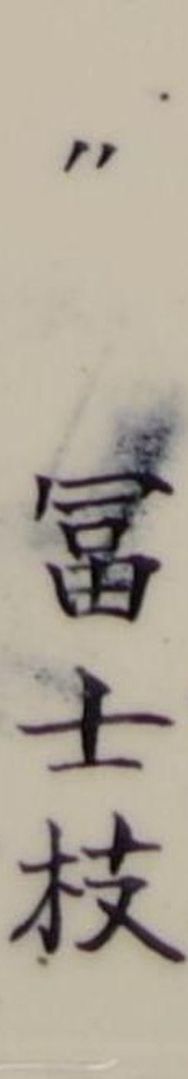冨士枝
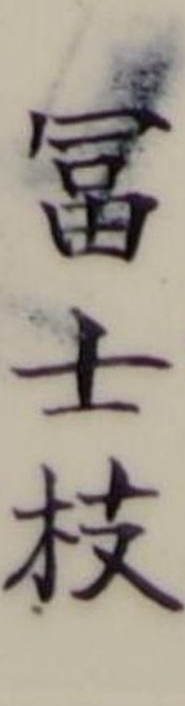冨士枝
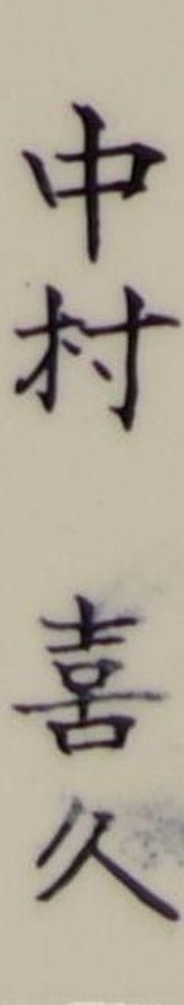中村喜久
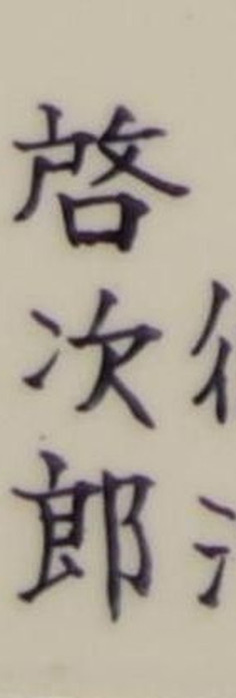啓次郎
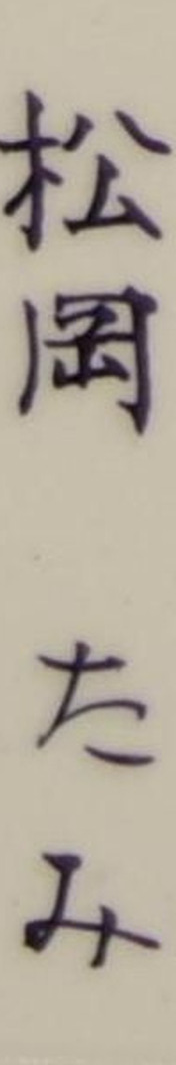松岡たみ
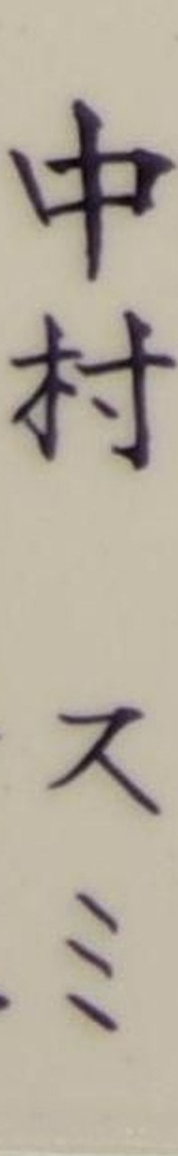中村スエ

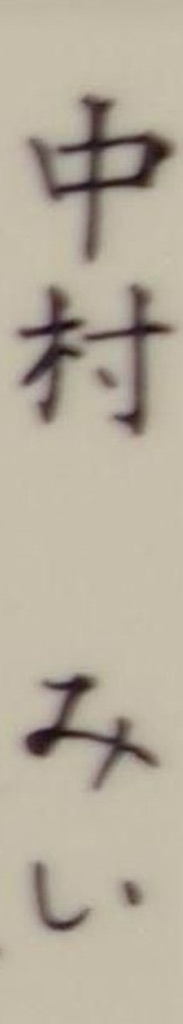中村みい
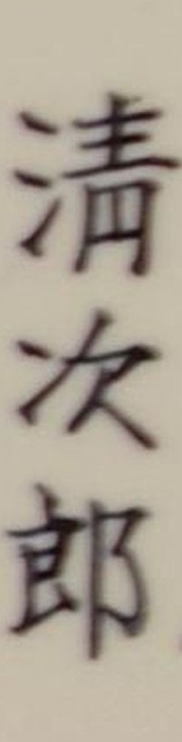清次郎
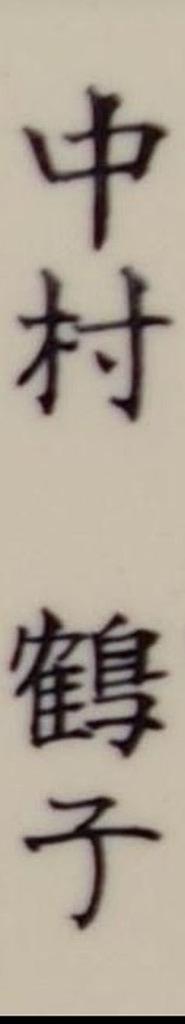中村鶴子
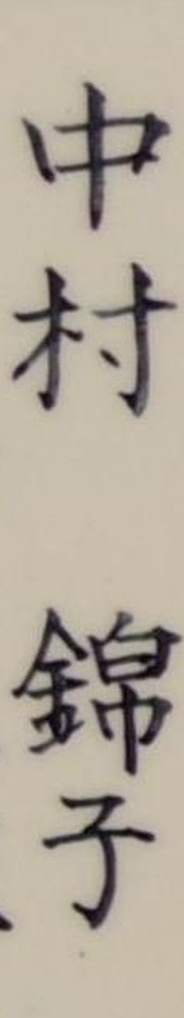中村錦子
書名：E~L
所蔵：高野山金剛峯寺
